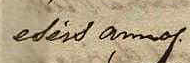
e seis annos.
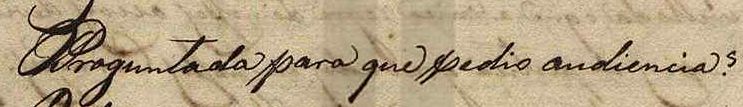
Proguntada para que pedio audiencia?
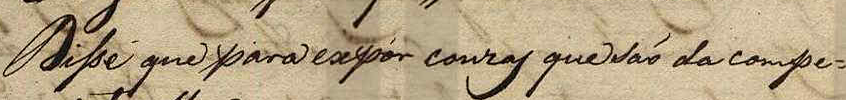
Disse que para expor couzas que saõ da compe
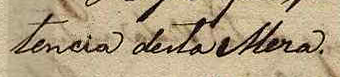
tencia desta Meza.
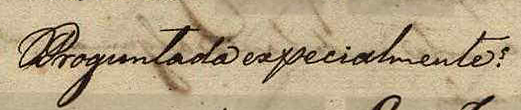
Proguntada expecialmente?
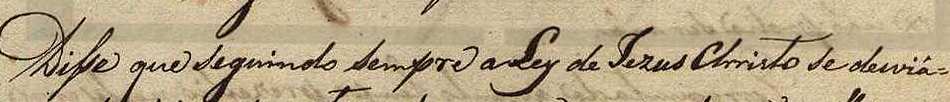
Disse que seguindo sempre a Ley de Iezus Christo se desviá
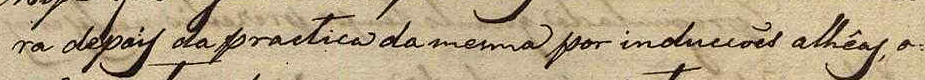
ra depois da practica da mesma por inducçoẽs alhéas, o
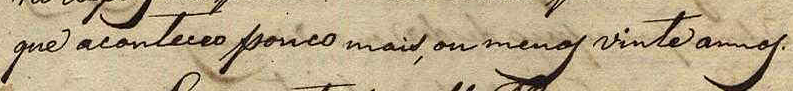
que aconteceo pouco mais, ou menos vinte annos.
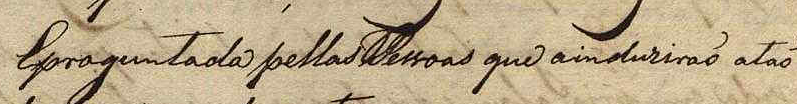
E proguntada pellas Pessoas que a induziraõ a taõ
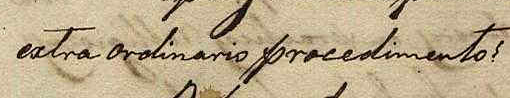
extraordinario procedimento?
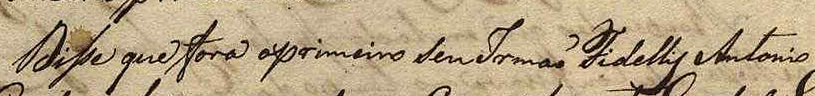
Disse que fora o primeiro seu Irmaõ Fidellis Antonio
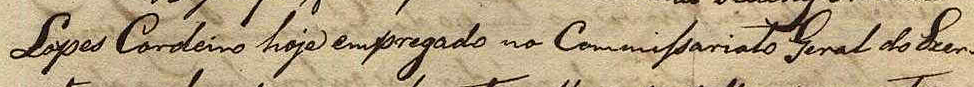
Lopes Cordeiro hoje empregado no Commissariato Geral do Exer
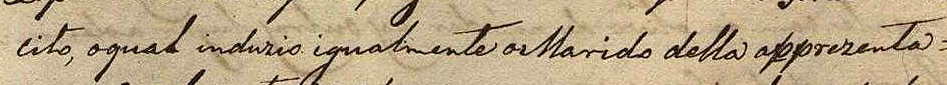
cito, o qual induzio igualmente o Marido della apprezenta
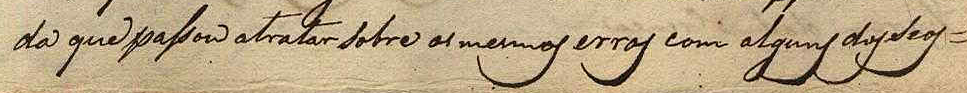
da que passou a tratar sobre os mesmos erros com alguns dos seos
